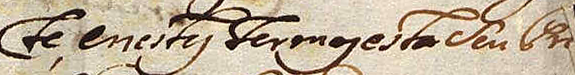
te, e nestes termos esta seu Pr
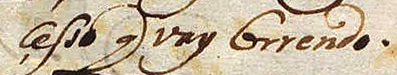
cesso q̄ vay Correndo.
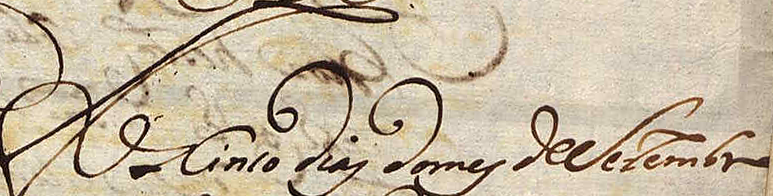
Aos Cinco dias do mes de Setembro
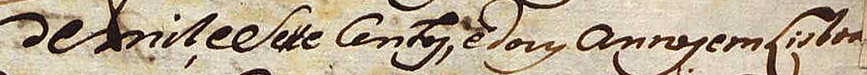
de mil, e Settecentos, e dous annos em Lisboa
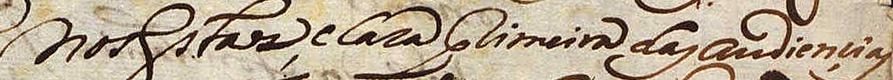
nos Estaos, e Caza pRimeira das audiencias
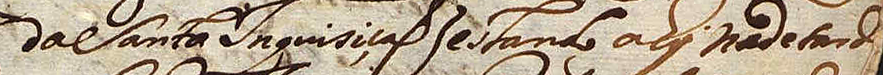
da Santa Inquisiçaõ estando ahy na de tard
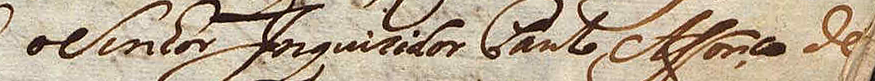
o Senhor Jnquizidor Paulo Affonço de
